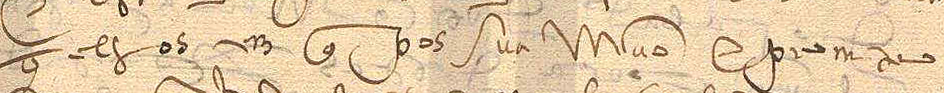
gelhos em q̅ pos sua Mão e prometeo
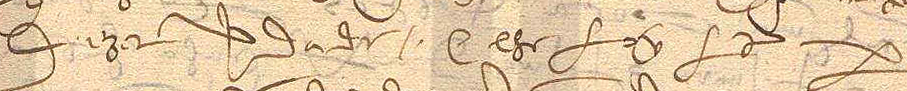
dizer ꝟdade /. e lhe foy fto ꝑ
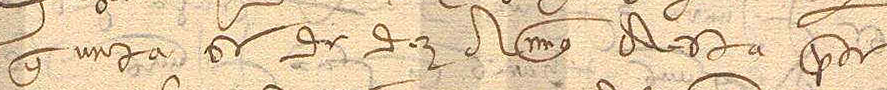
gunta se de dez Ann̄ꝯ A esta p̄te
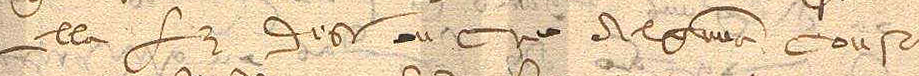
ella fez dise ou creo Algūua cousa
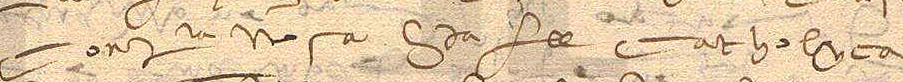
Contra nosa Sta fee catholyca
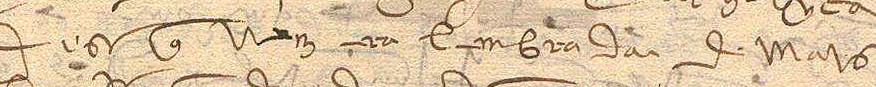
dise q̄ nom era lembrada de majs
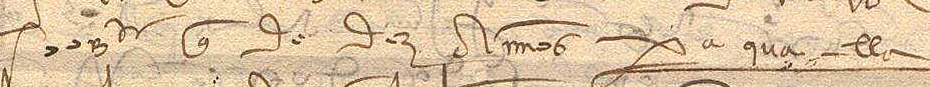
soomte q̅ de dez An̄nos ꝑa qua ella
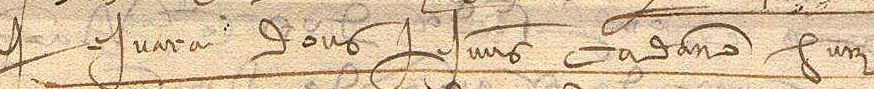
JeJuara dous JeJūus cadan̄o hum
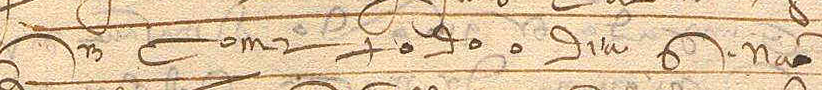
sem Comer todo o dia senão
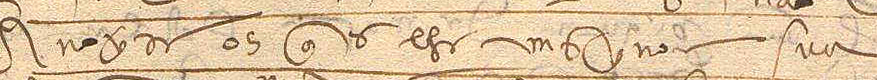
A noyte os q̄es lhe emsynou sua
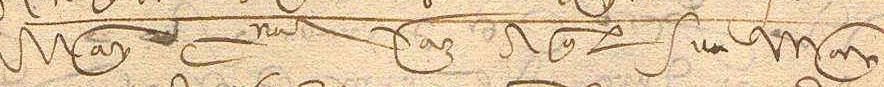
Māy Cna Vāz A q̄L sua May
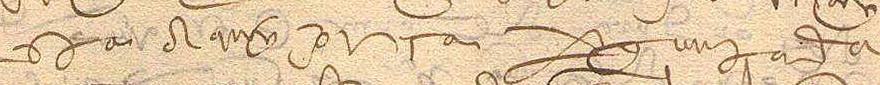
esta Aquy presa ꝑguntada
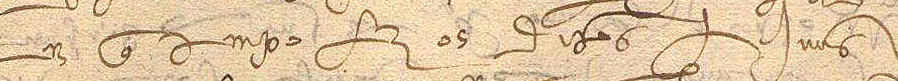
em q̄ tempo fez os dit̄os JeJuūs
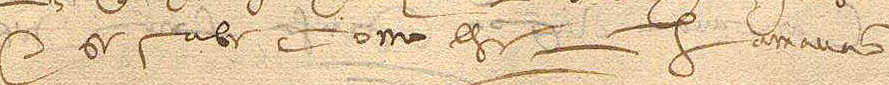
e se sabe como lhe chamauaõ
